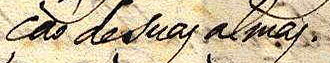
çaõ de suas almas.
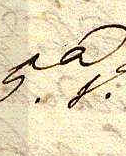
5.a t.a
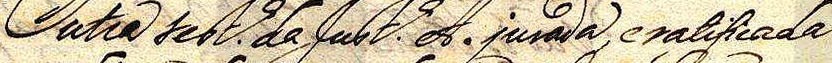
Outra test.a da Just.a jurada, e ratificada
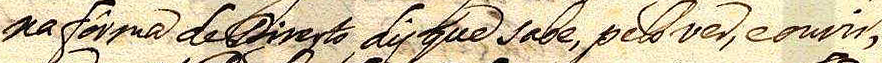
na fôrma de Direito dis que sabe, pelo ver, e ouvir,
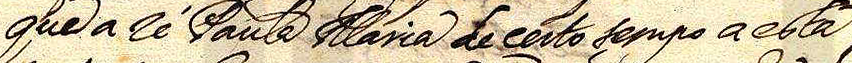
que a Ré Paula Maria de certo tempo a esta
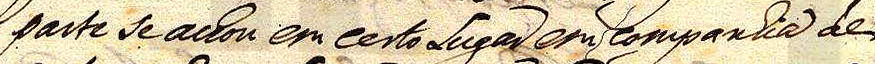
parte se achou em certo lugar em companhia de
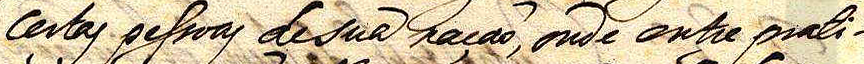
certas pessoas de sua naçaõ, onde entre pra
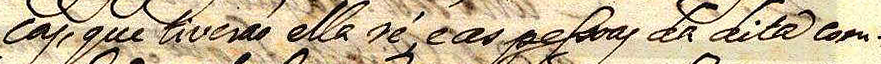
ticas, que tiveraõ ella ré, e as pessoas da dita com
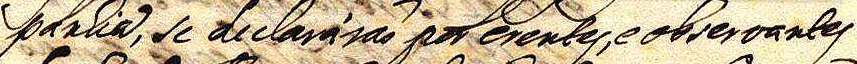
panhia, se declaráraõ por crentes, e observantes
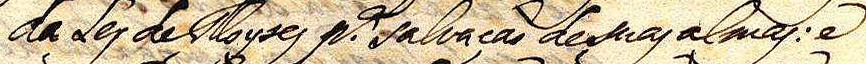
da Ley de Moyzes p.a salvaçaõ de suas almas: e
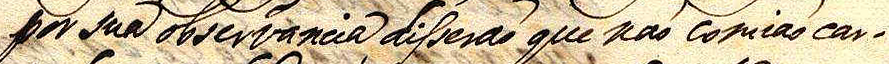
por sua observancia disseraõ que naõ comiaõ car
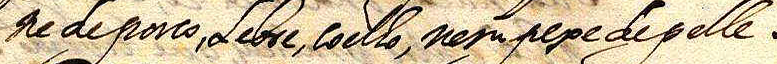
ne de porco, Lebre, coelho, nem pexe de pelle.
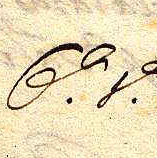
6.a t.a
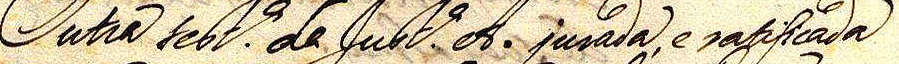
Outra test.a da Just.a A. jurada, e ratificada
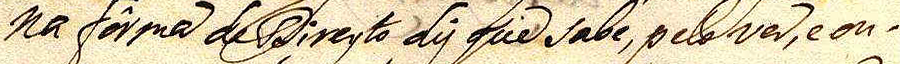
na fôrma de Direyto dis que sabe, pelo ver e ou
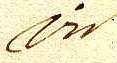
vir
